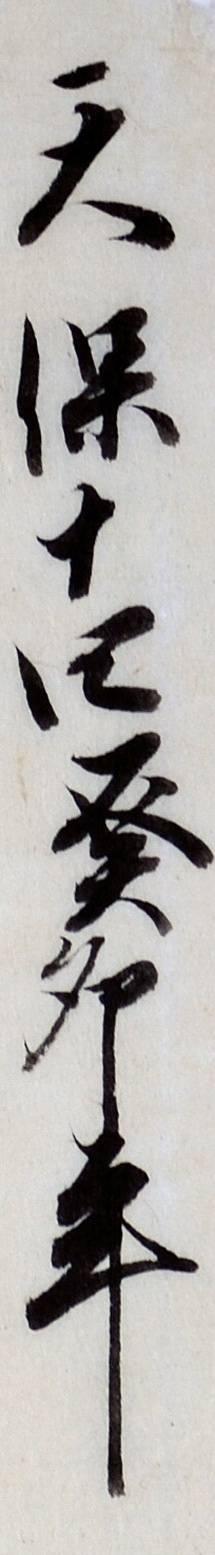天保十四癸卯年
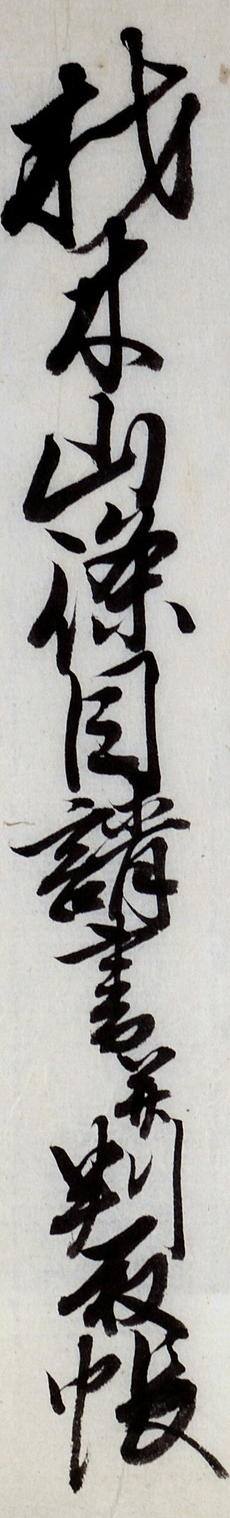材木山條目請書并判取帳
